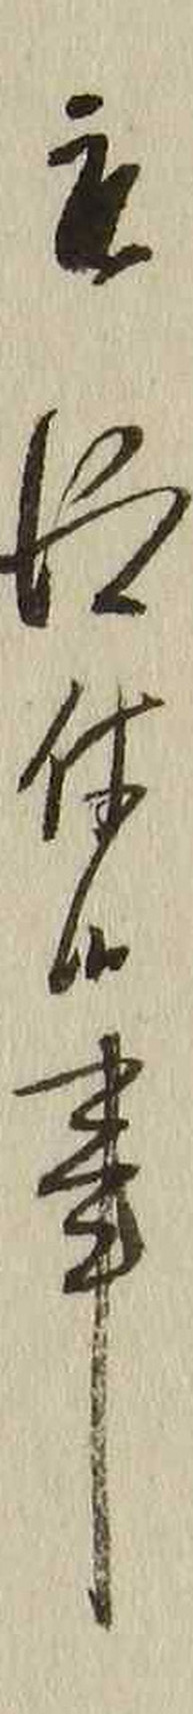被仰付候事
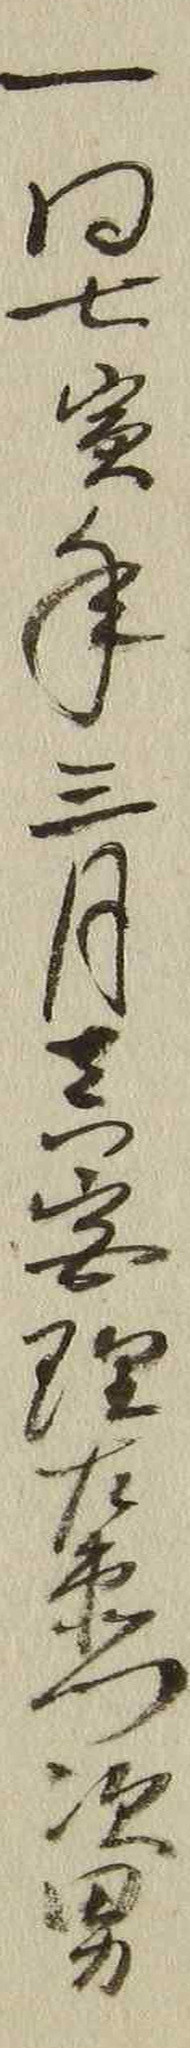一同七寅年三月真宮理左衛門次男
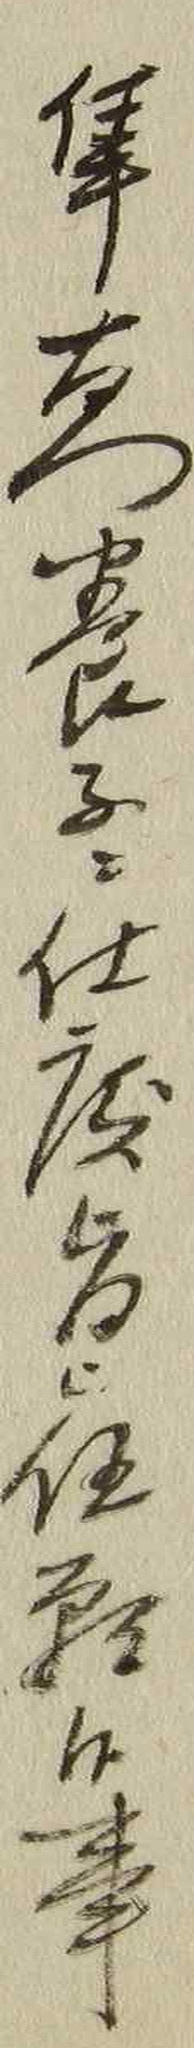隼右衛門養子ニ仕度旨被任願候事
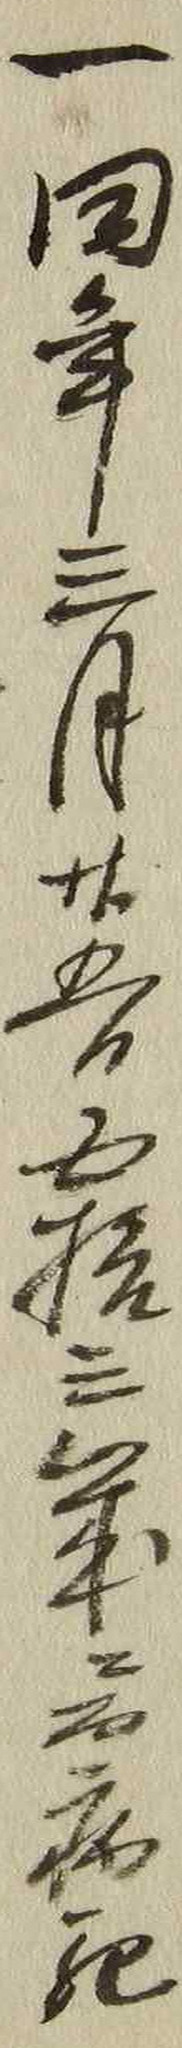一同年三月廿五日五拾三歳ニ而病死
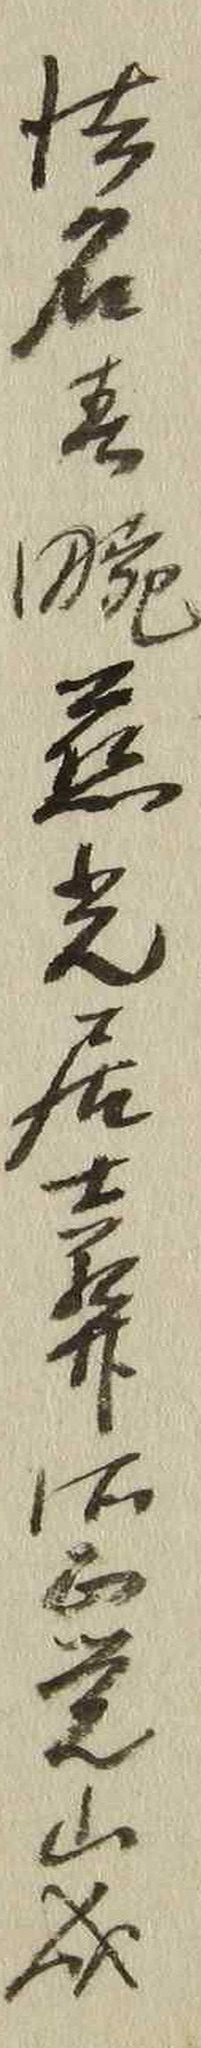法名春晼慈光居士葬所正覚山成
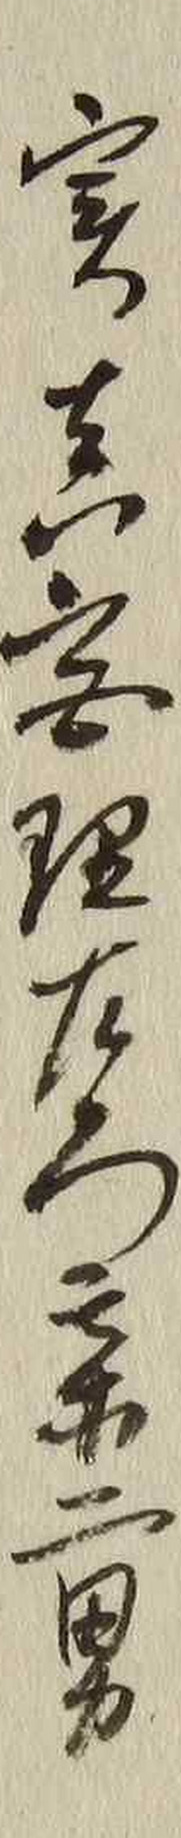実真宮理左門某二男
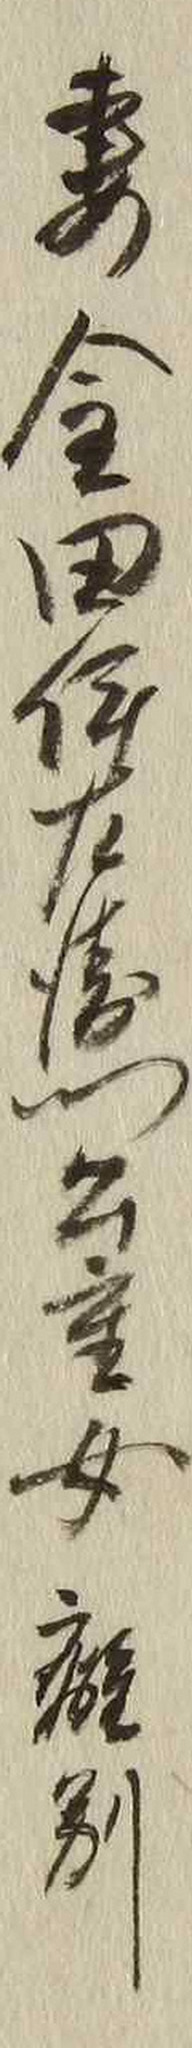妻金田伊左衛門公重女離別
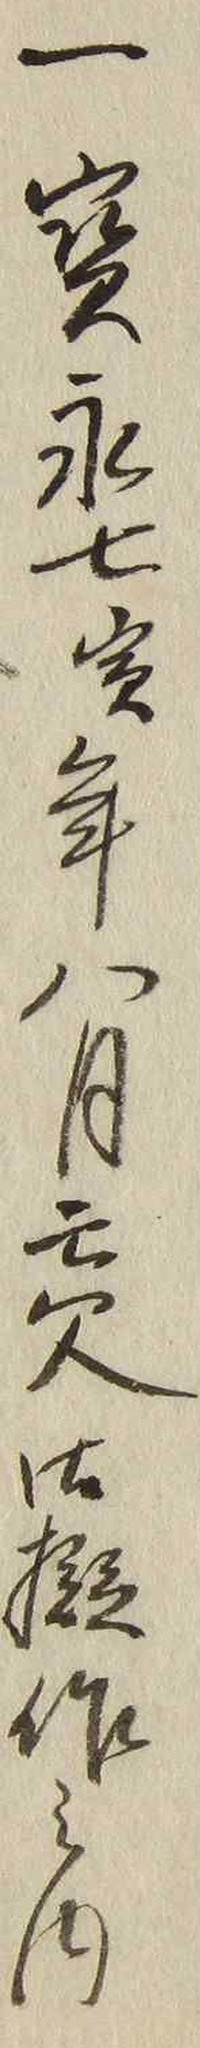一宝永七寅年八月亡父御擬作之内
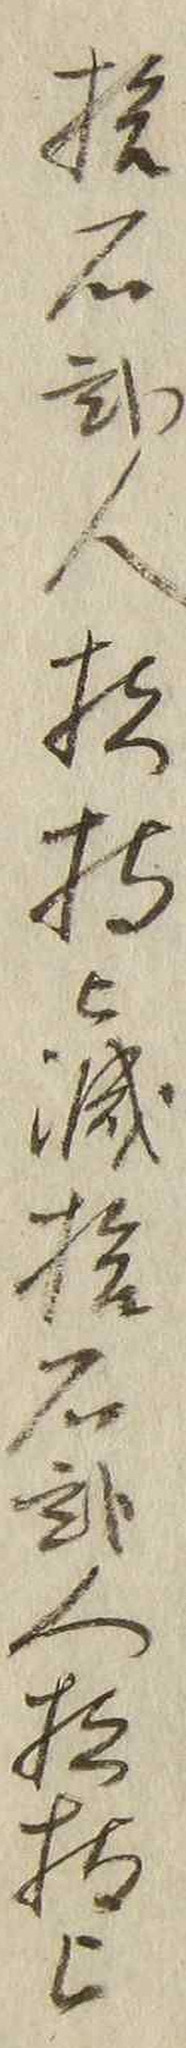拾石弐人扶持被減拾石弐人扶持被

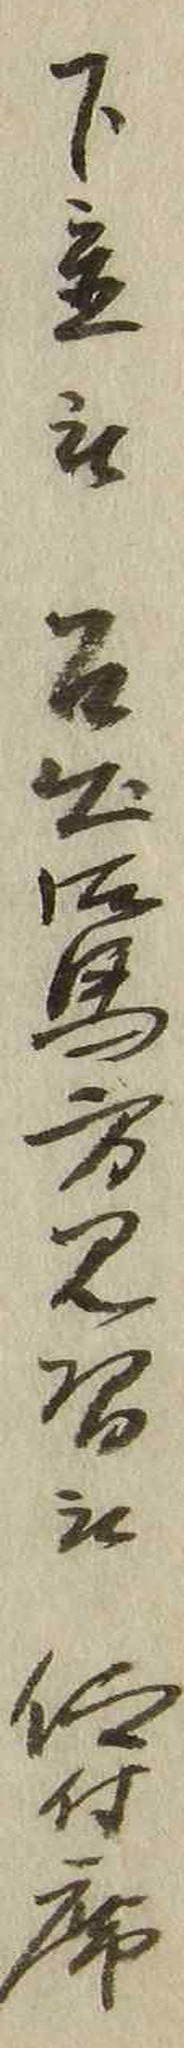下置被召出御馬方見習被仰付席
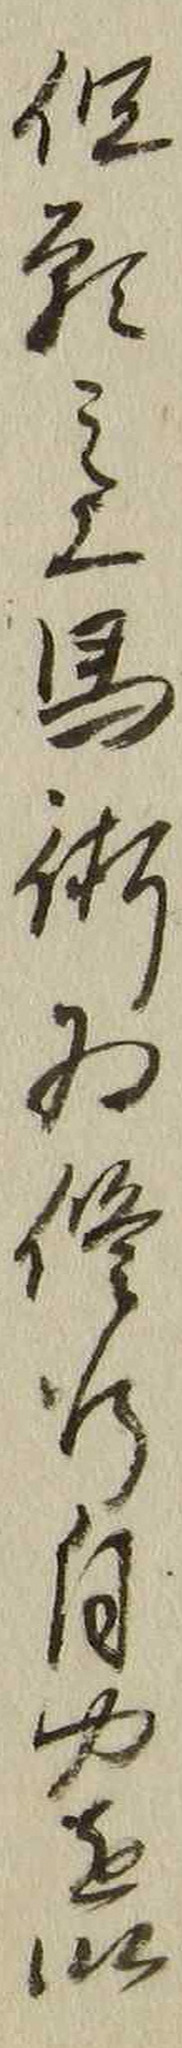但願之上馬術為修行自力を以
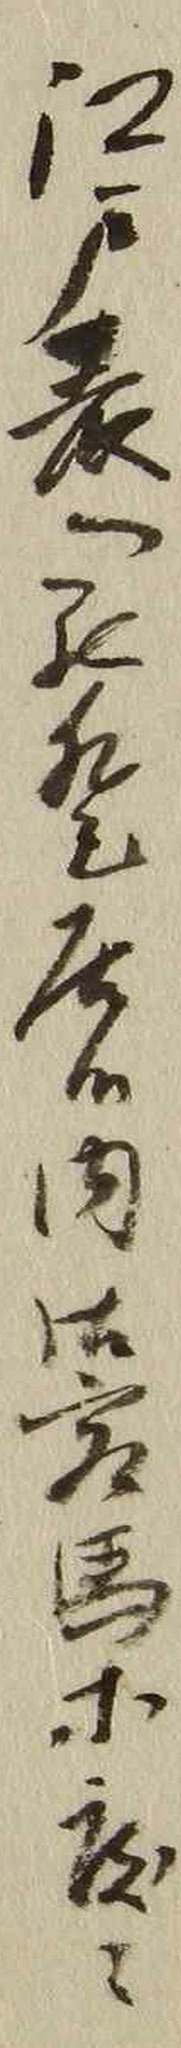江戸表へ罷登居候内御最馬等度々
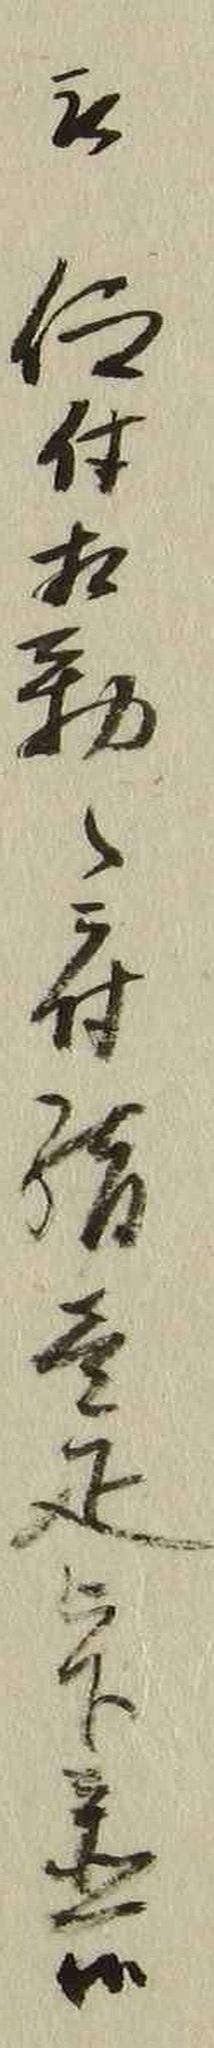被仰付相勤候ニ付絹壱疋被下置候
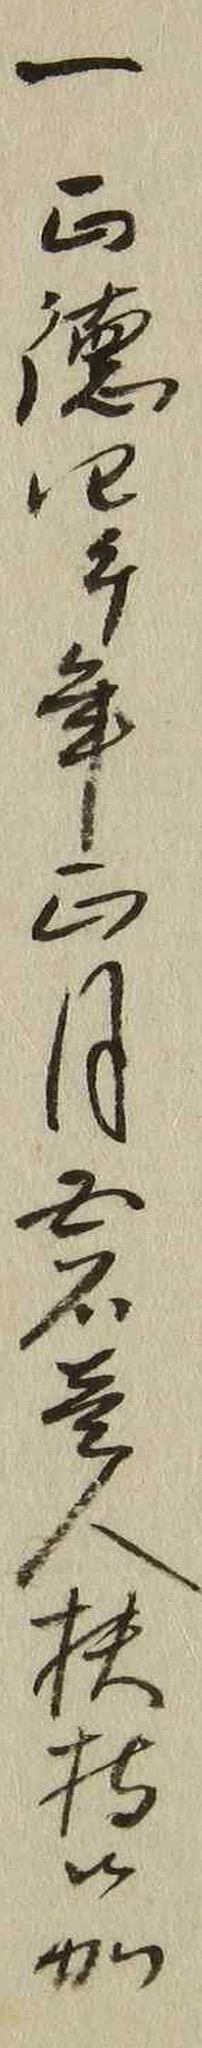一正徳四午年正月五石壱人扶持御加
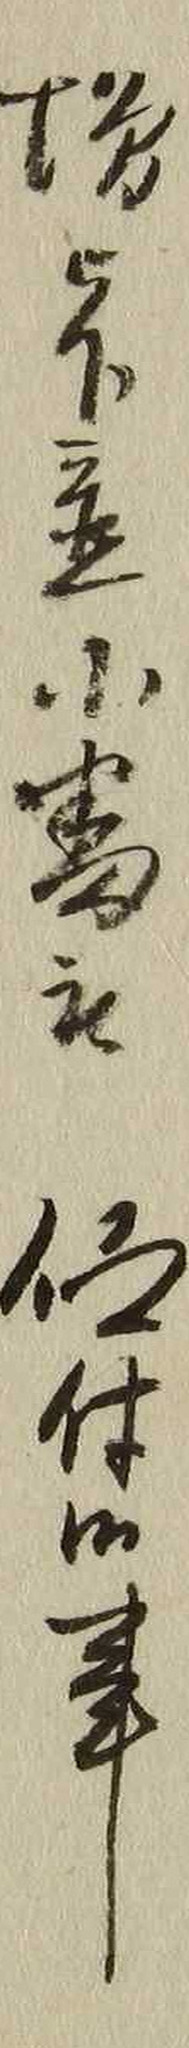増被下置小番被仰付候事
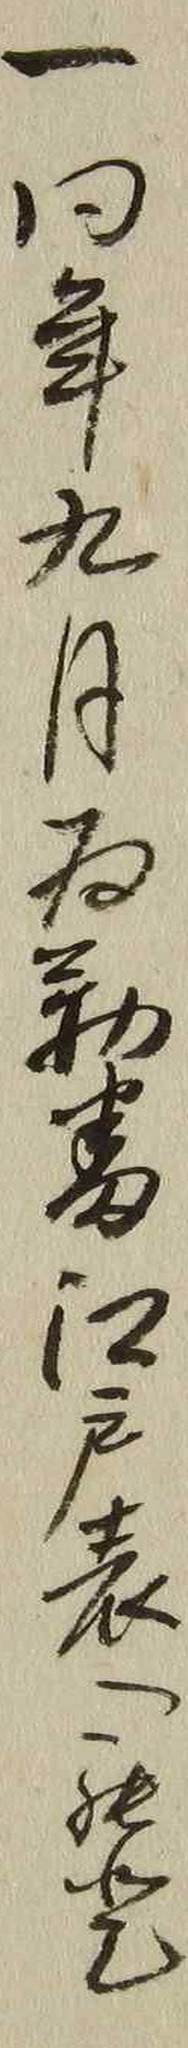一同年九月為勤番江戸表へ罷登
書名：諸士系譜　巻之359　す之部9
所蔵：会津若松市立会津図書館
